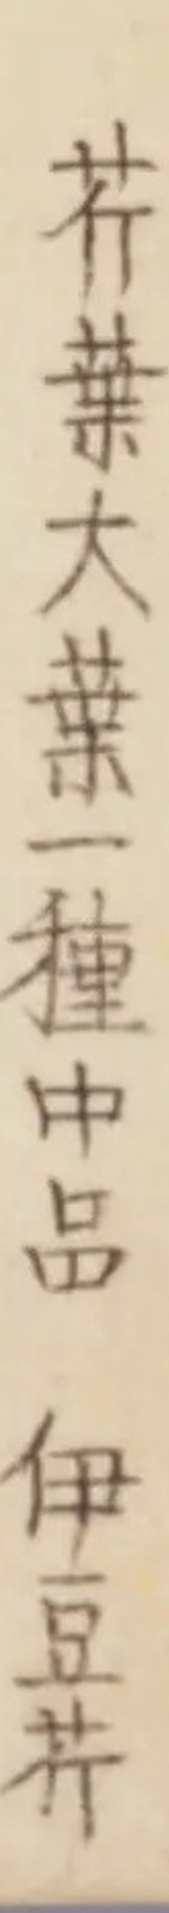芹葉大葉一種中品伊豆芹
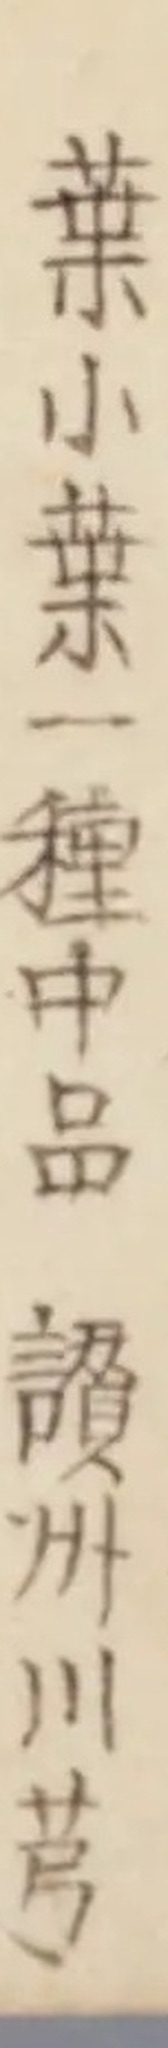葉小葉一種中品諸州川芎
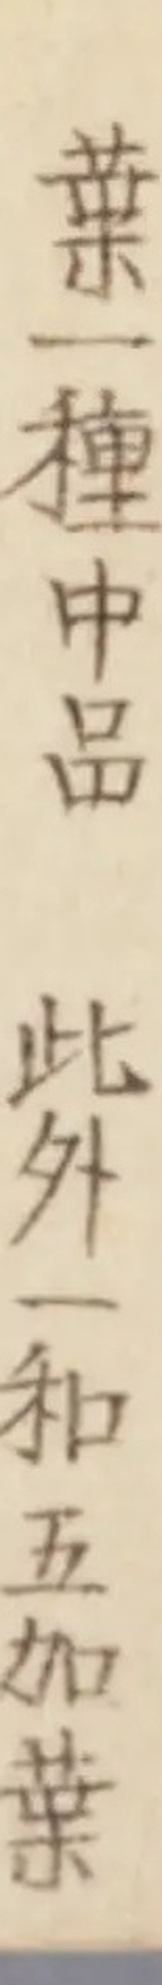葉一種中品此外一和加葉
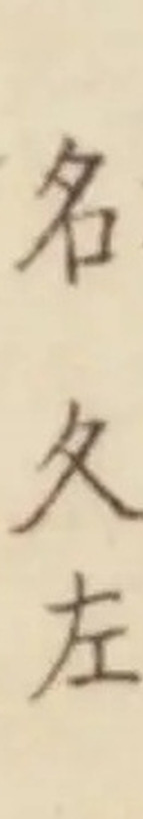名久左
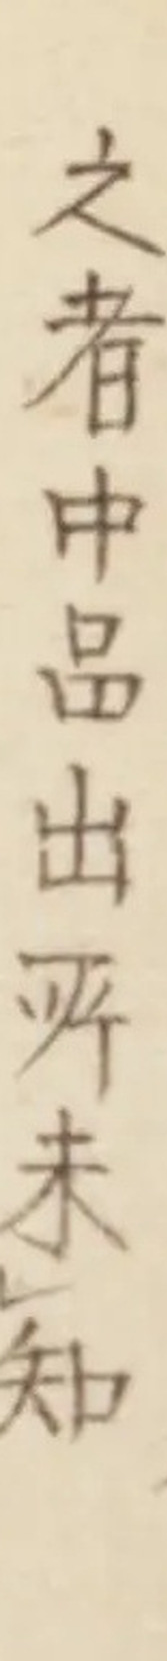之者中品出所未知
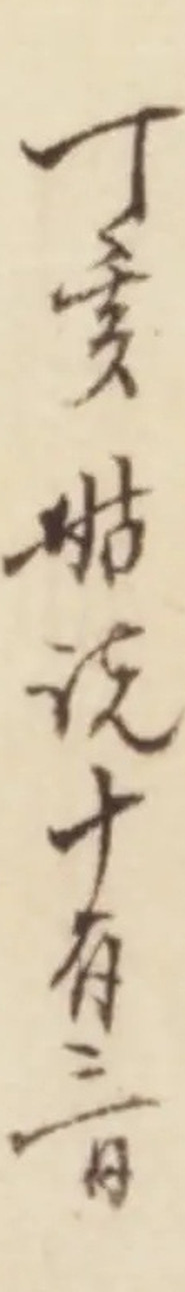丁亥姑洗十有三日
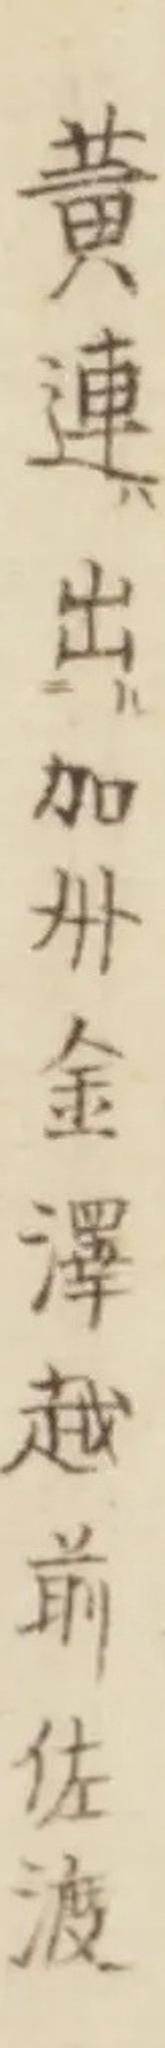黄連ハ出ル加州金澤越前佐渡
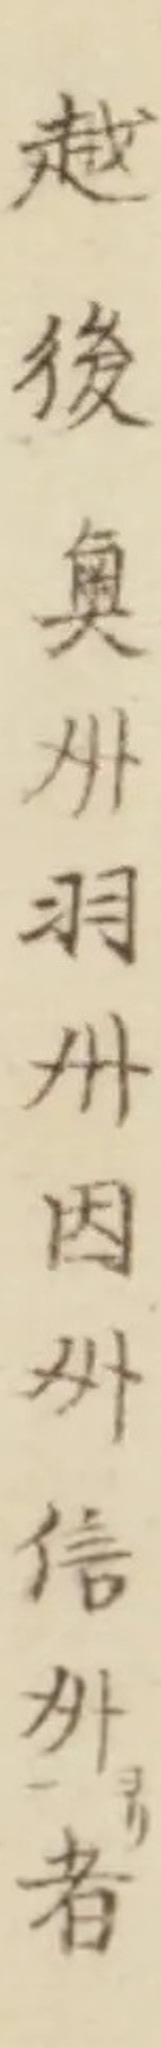越後奥州羽州因外信外ヨリ者
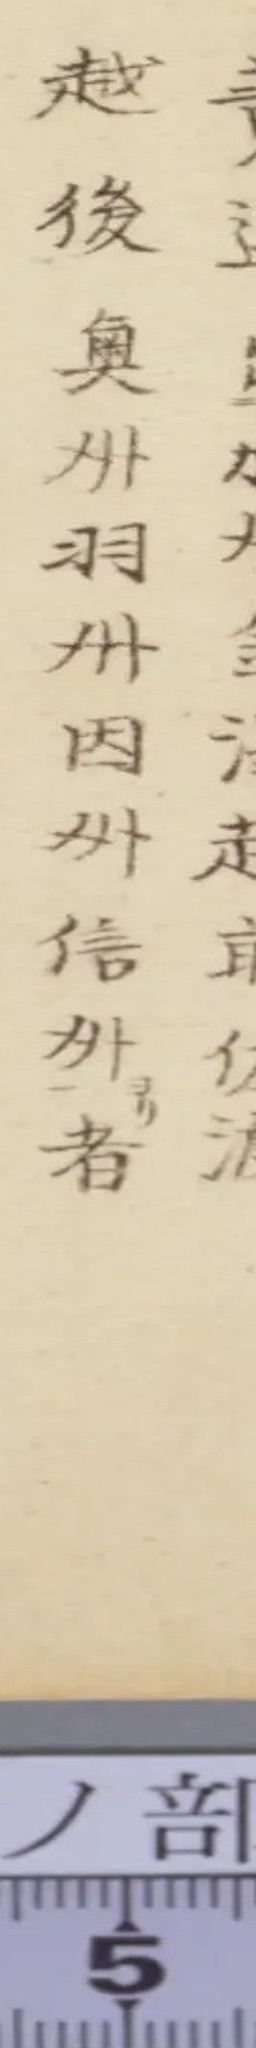越後奥州羽州因外信外ヨリ者
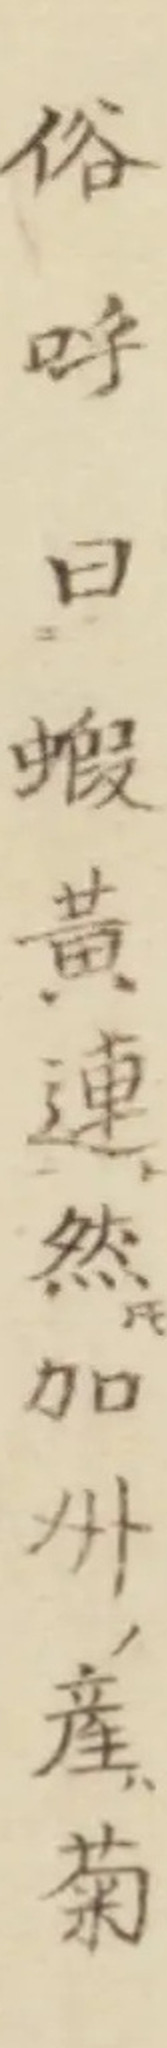俗呼曰蝦黄連ト然共加州ノ産は菊
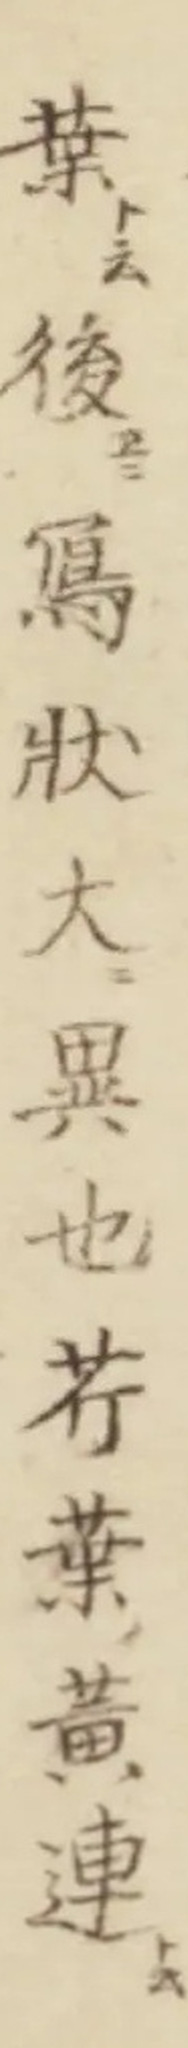葉ト云後ニ寫状大ニ異也芹葉ノ黄連ト云
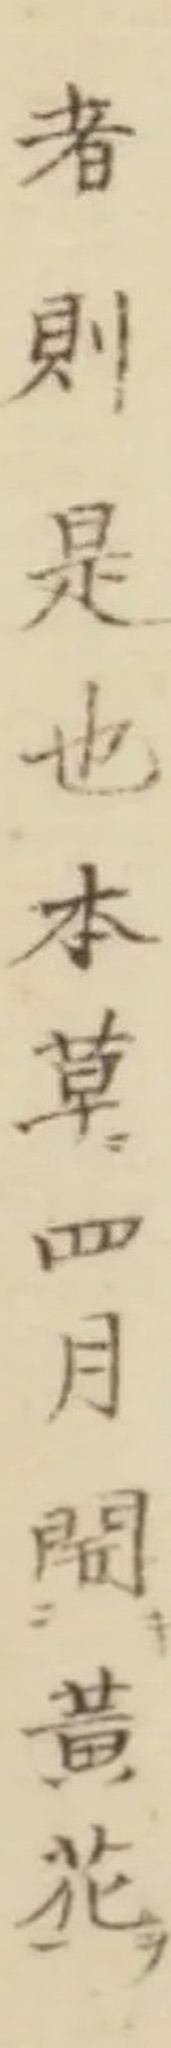者則是也本草四月開キ黄花ヲ
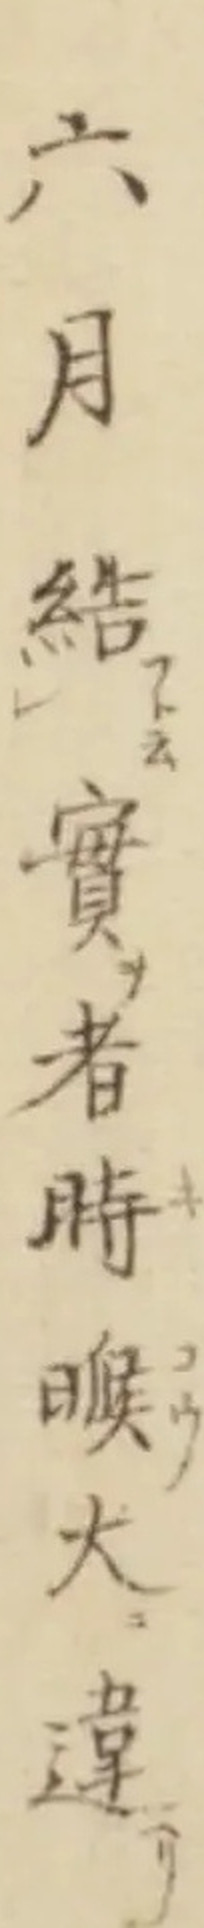六月結フト云實ヲ者時睺大ニ違ヘリ

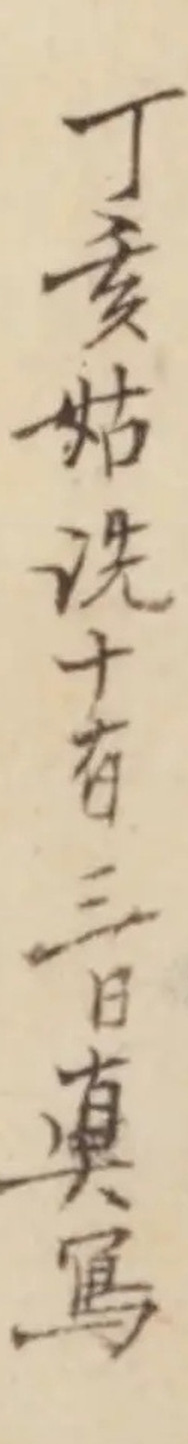丁亥姑洗十有三日真寫
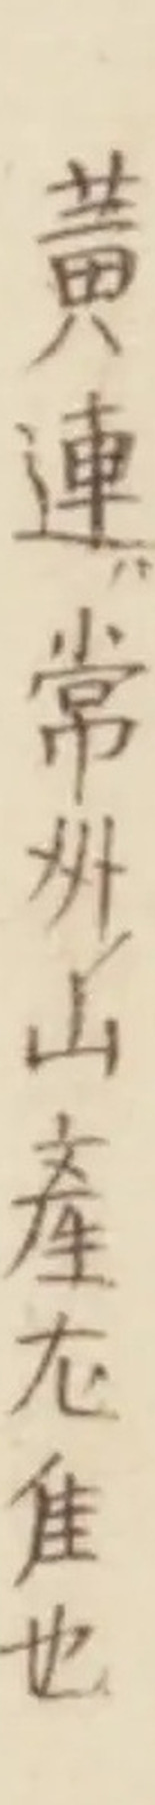黄連は常州の産尤隹也
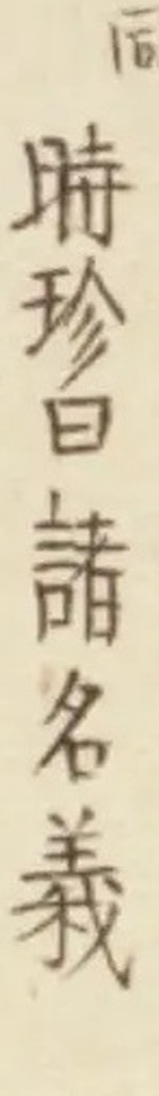時珍曰諸名義
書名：梅園草木花譜春之部. 3
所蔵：国立国会図書館 National Diet Library, JAPAN
